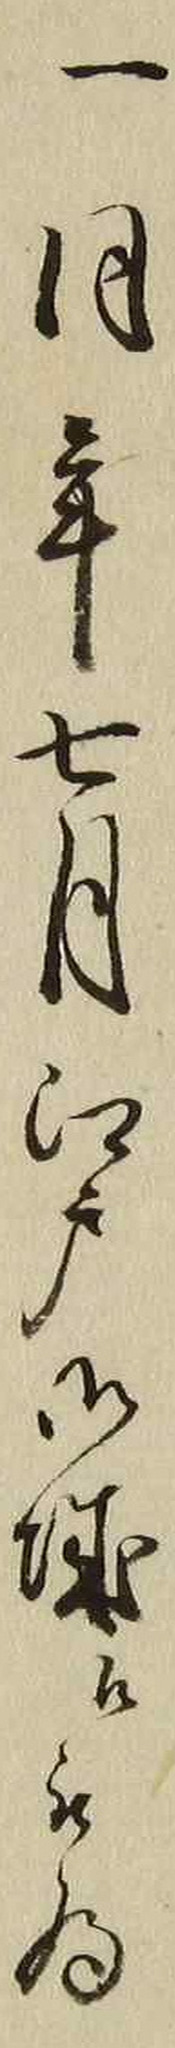一同年七月江戸御城江被為
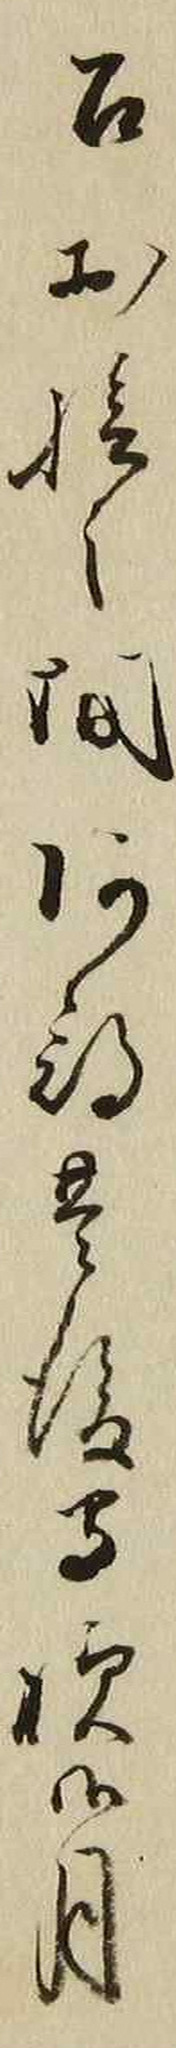召於桧之間阿部豊後守様御月
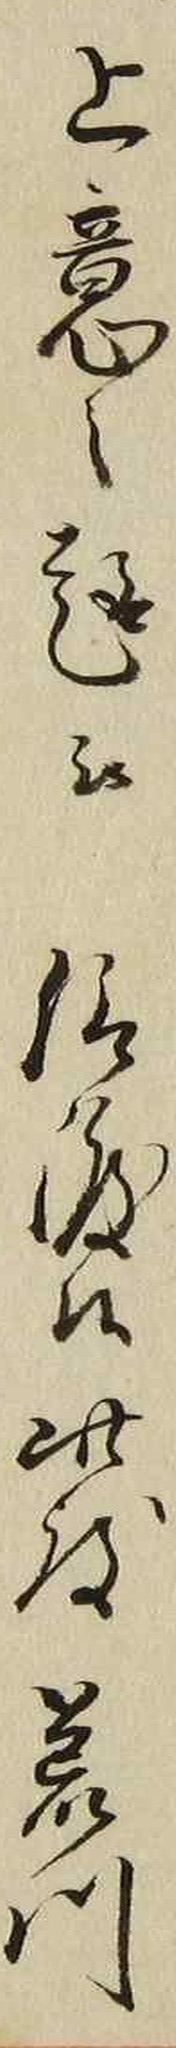上意之趣被被仰渡候此度荒川
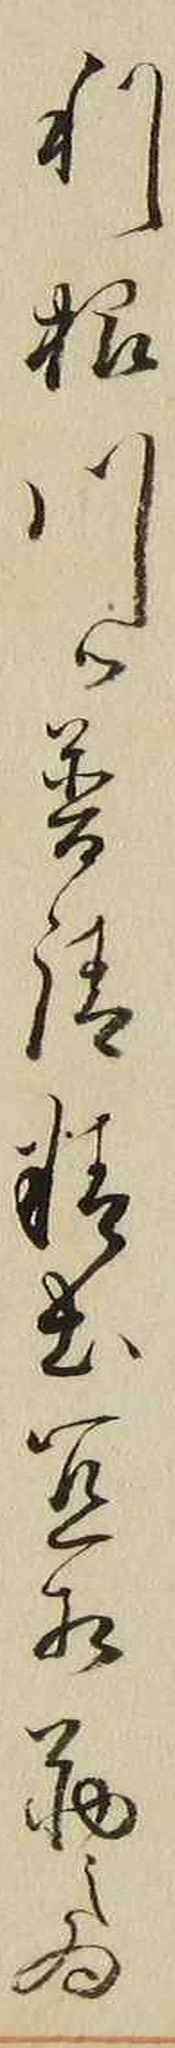利根川御普請精出宜相勤之為
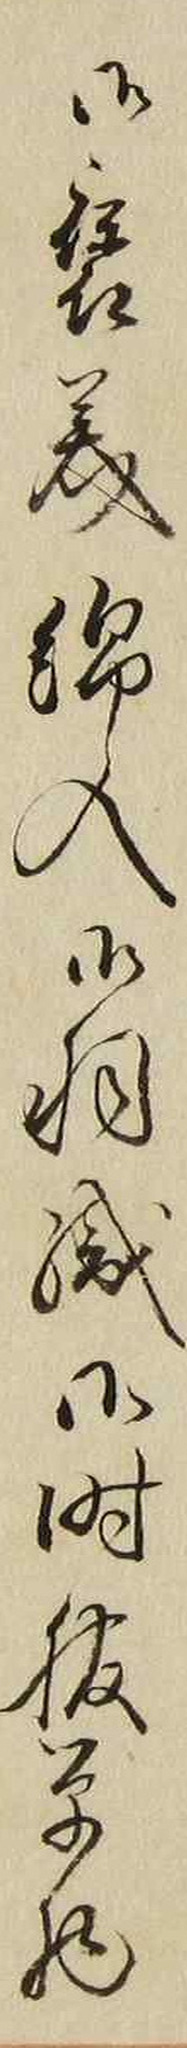御褒美綿入御羽織御時服単物
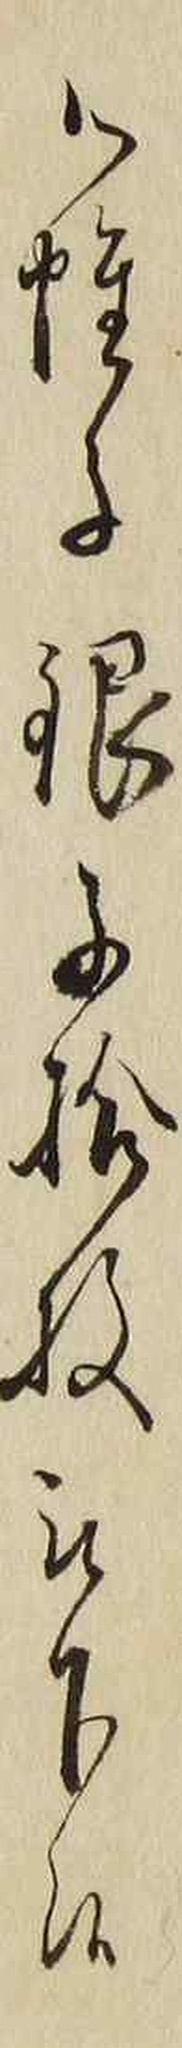御帷子銀子拾枚被下候
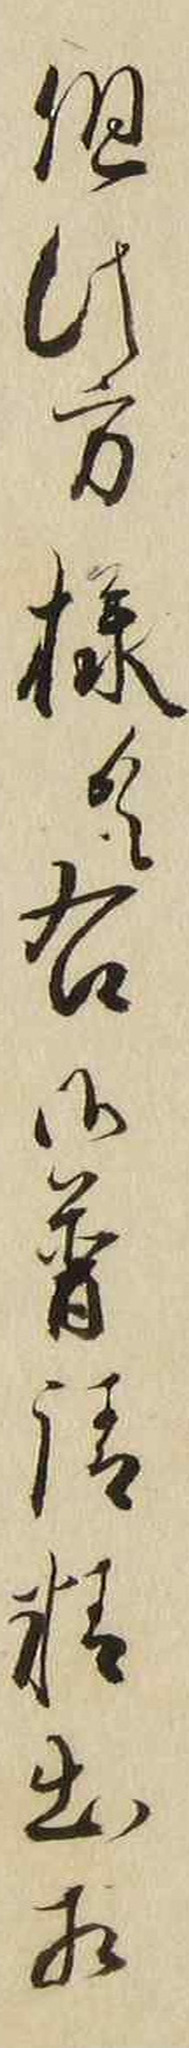但此方様ゟも右御普請精出相

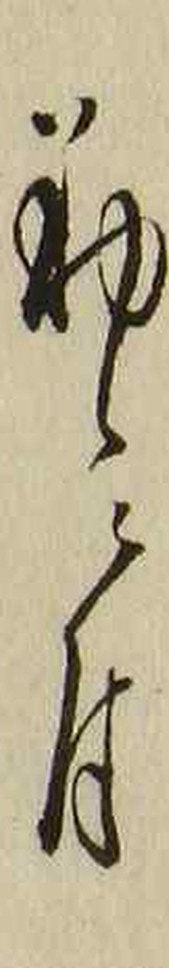勤候ニ付
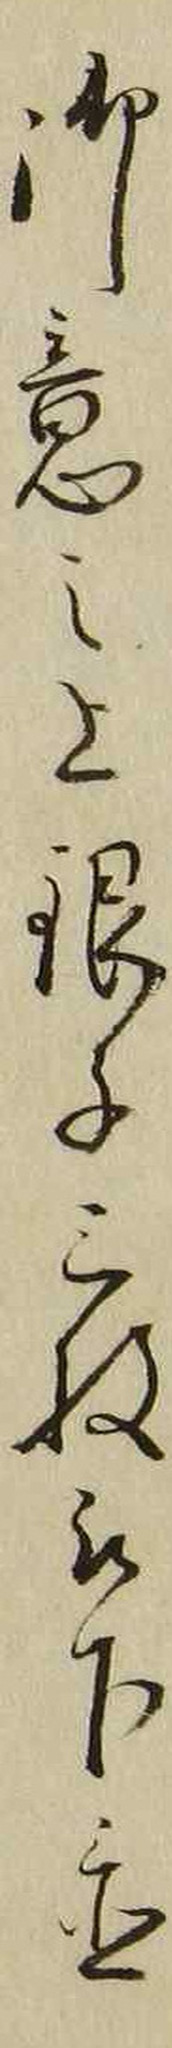御意之上銀子三枚被下置
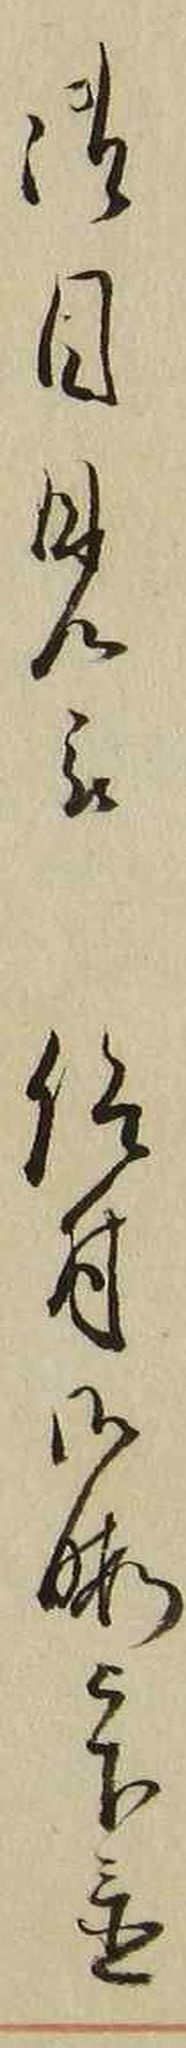御目見被仰付御暇被下置
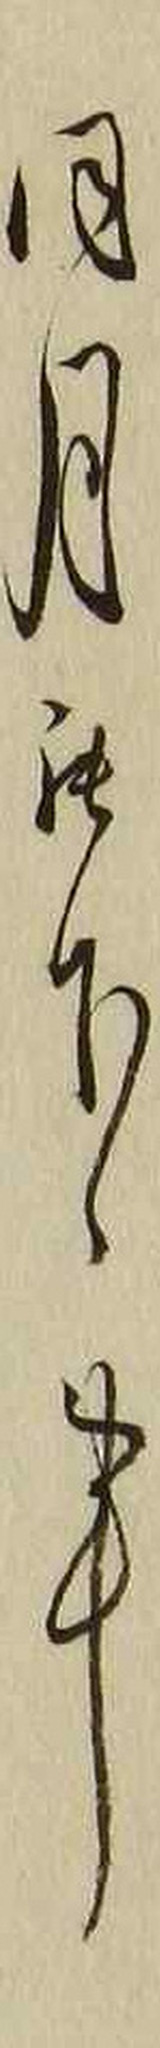同月罷下候事
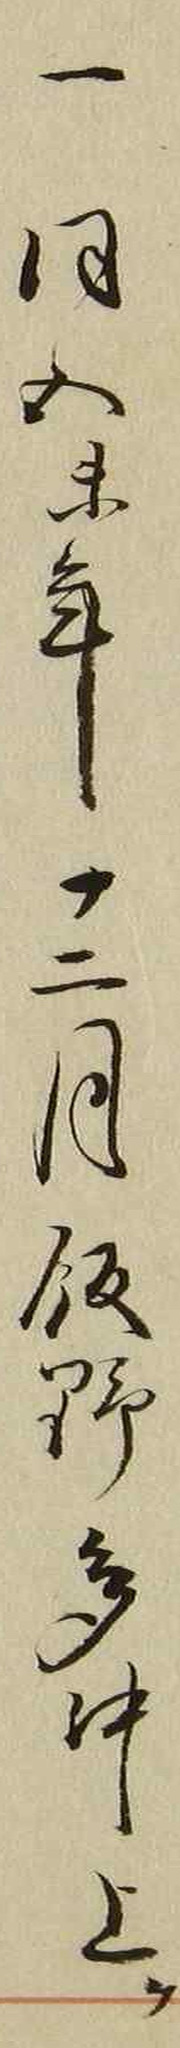一同五未年十二月飯野多中上ケ
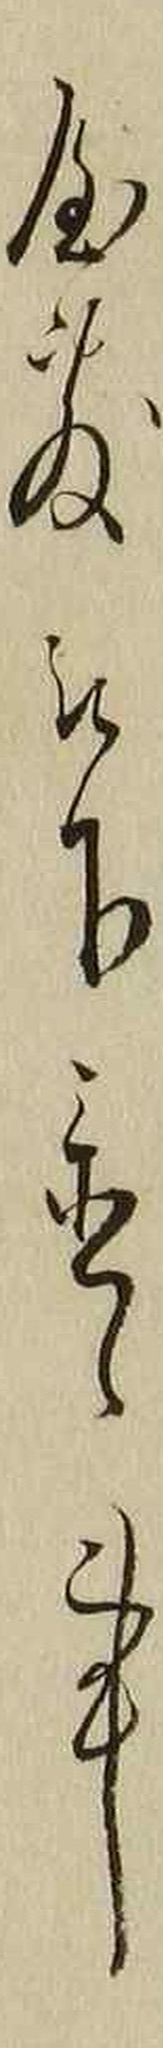屋敷被下置候事
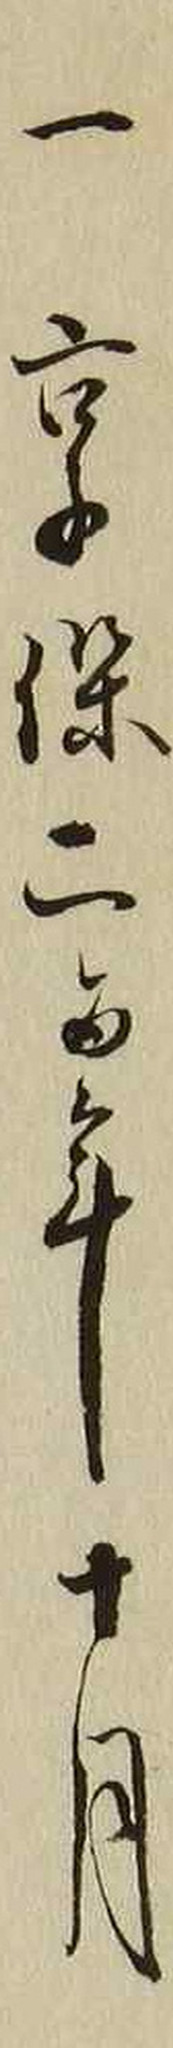一享保二酉年十月
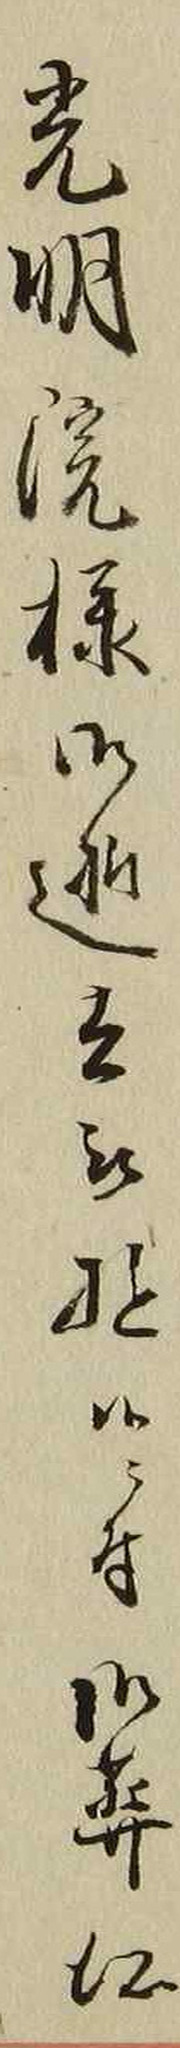光明院様御逝去被遊候ニ付御葬所
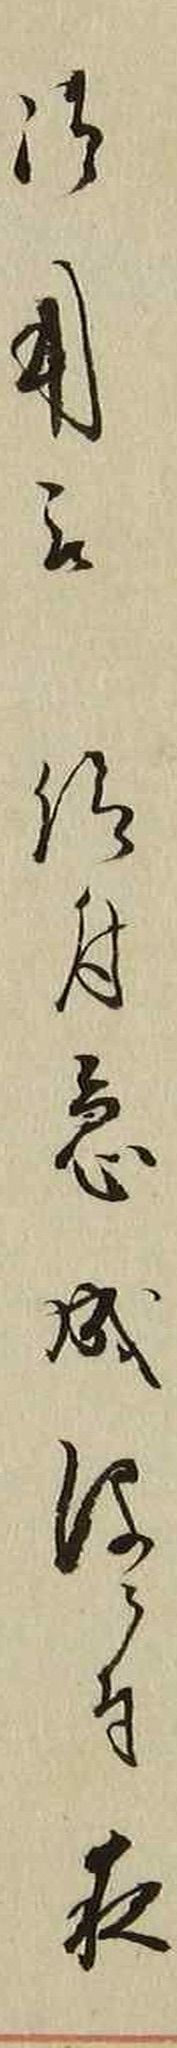御用被仰付急成儀ニ付夜
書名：諸士系譜　巻之1　い之部1
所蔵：会津若松市立会津図書館
